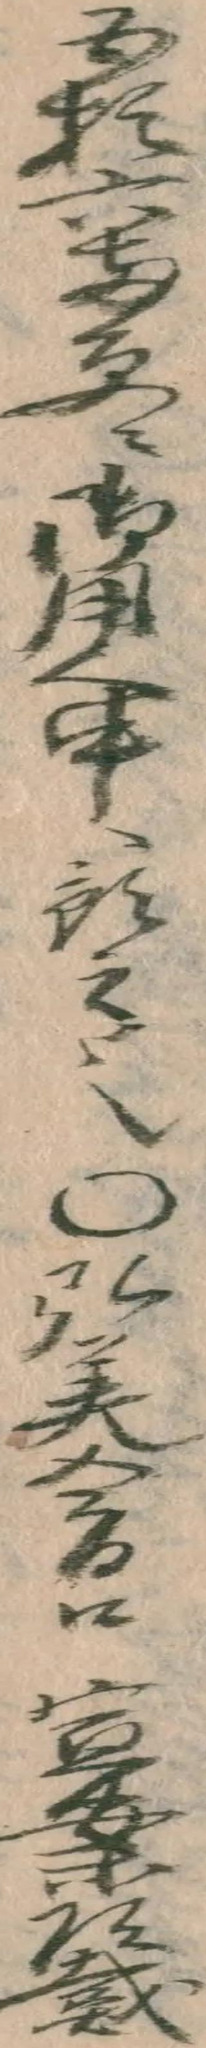五拾六両更に御用人中へ預之也○弘美今日口宣案頂戴
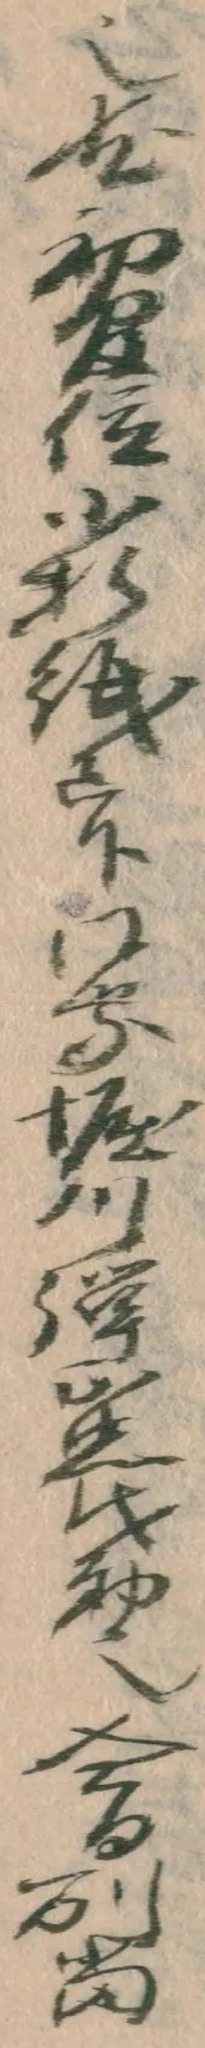也尤初官位小折紙已下同家堀川弾正忠代勤也今日別當
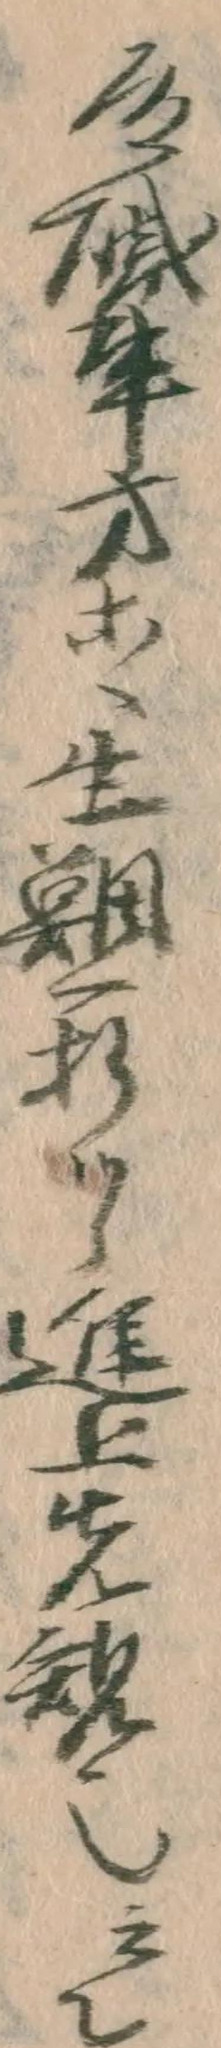殿職事方等へ生鯛一折ツヽ進上先規也云々
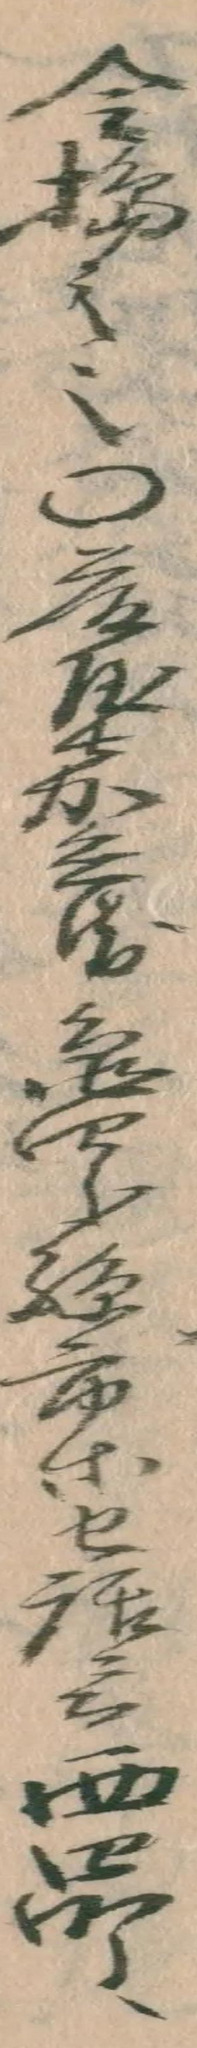令搗之也○藤屋嘉兵衛亀四郎孫市等世話ニ而西四町へ
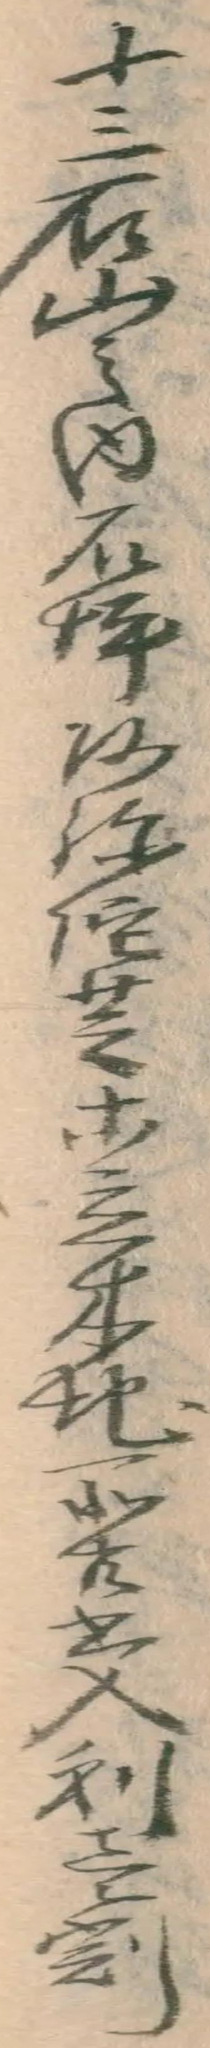十三石山之内石坪阿弥陀芝等立木地所共書入利壱割
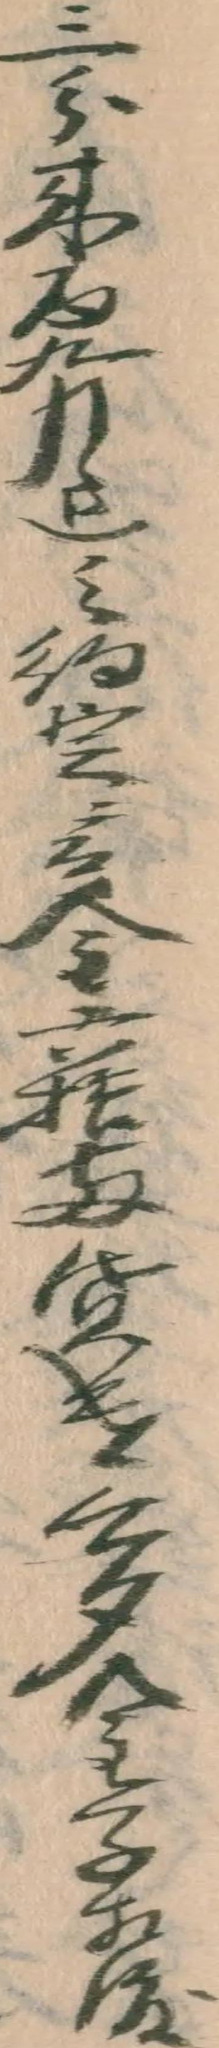三分来酉九月迄之約定ニ而金六拾両貸遣今夕金子相渡
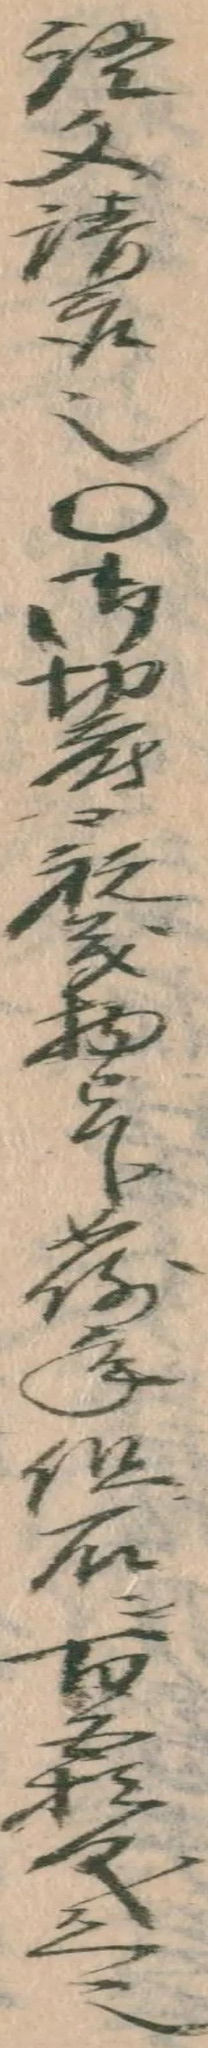證文請取也○御切府御祝義物被下如例年但辰ニ百五拾匁位也
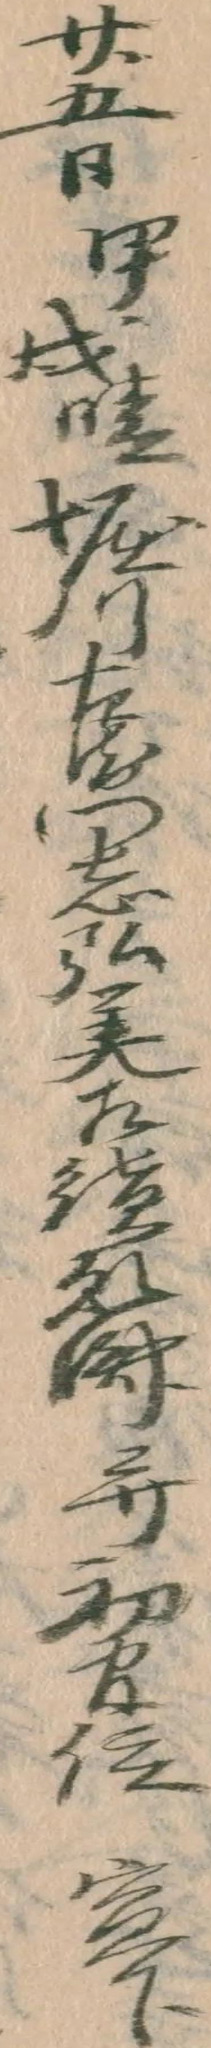廿五日甲戌晴堀川左衛門志弘美相続願済并初間位宣下
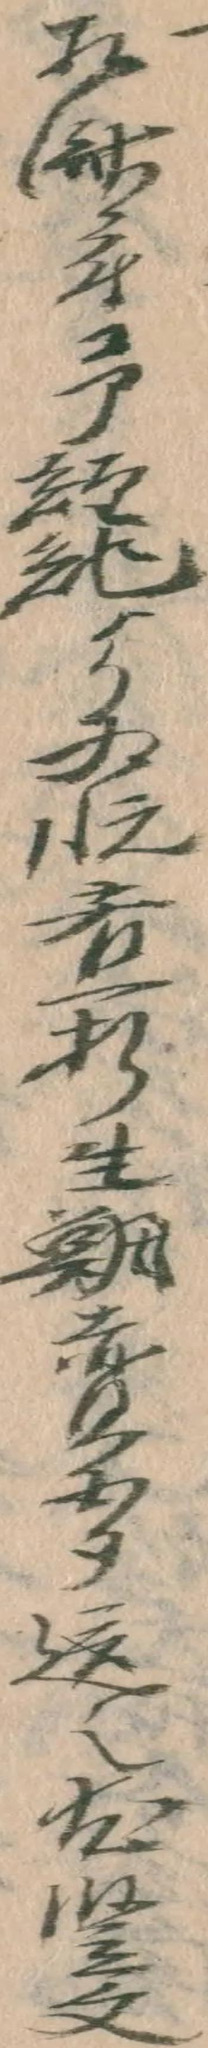相済ニ付予経紀より為祝肴一折生鯛赤貝五夕送之尤堅文
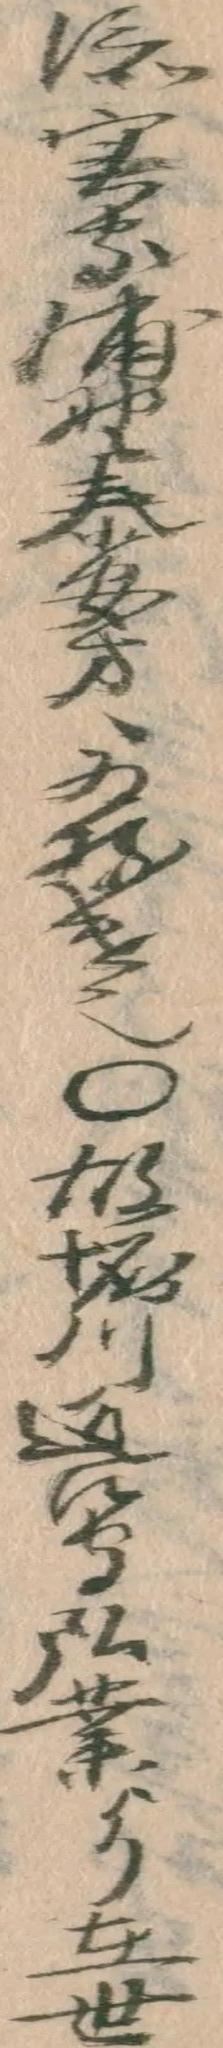添実家浦野泰安方へ為持遣也○故堀川近江守弘業より在世
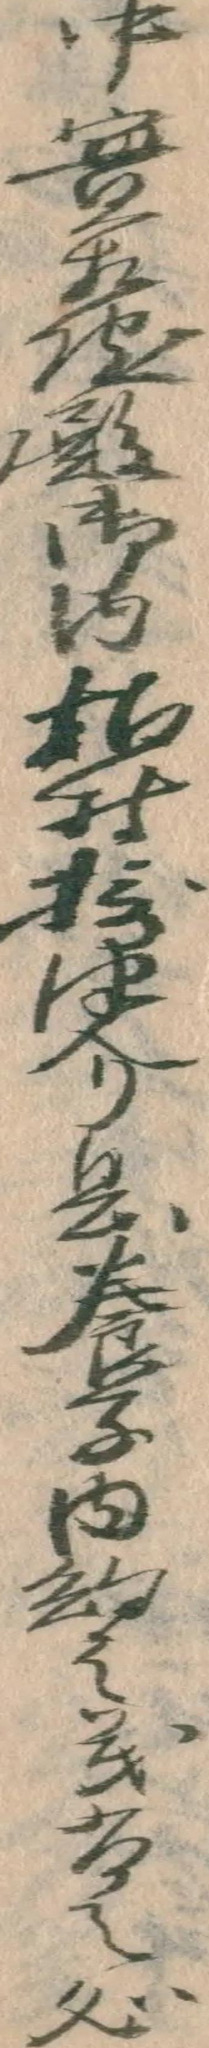中實相院殿御内栃村摂津介息養子内約之義有之処
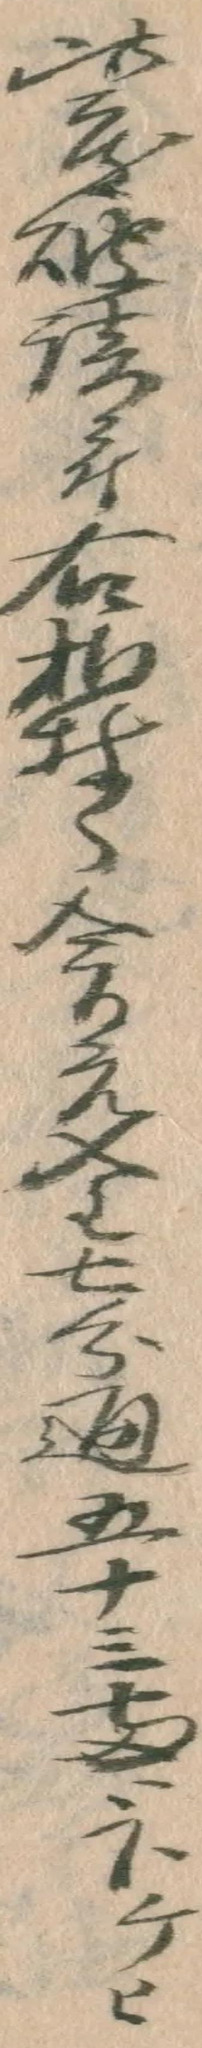此度破談ニ付右柏村へ今日元金七分通五十三両御下ケ被
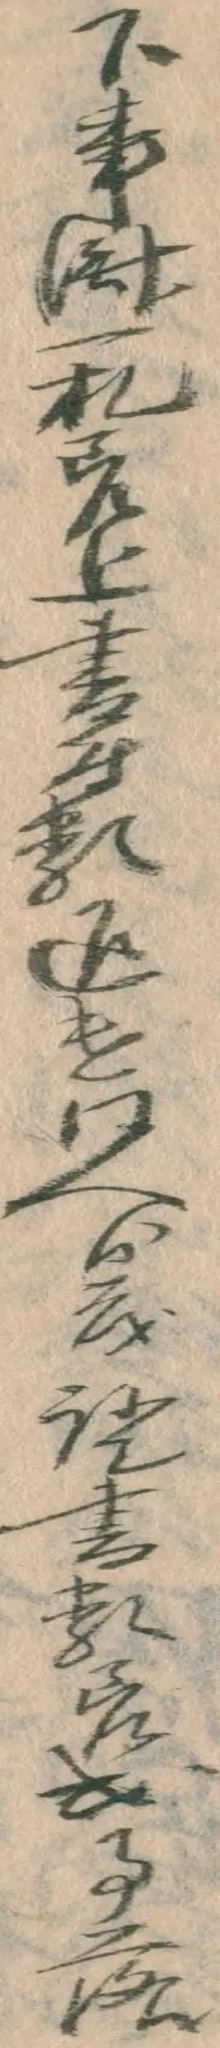下事済一札差上書付類返遣同人ゟも證書類差出事二條
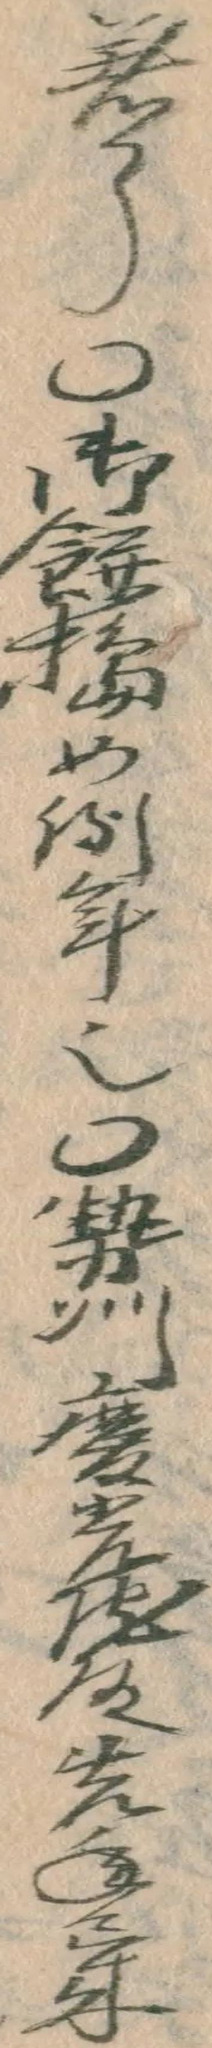着了〇御餅搗如例年也○勢州慶光院殿先年已来
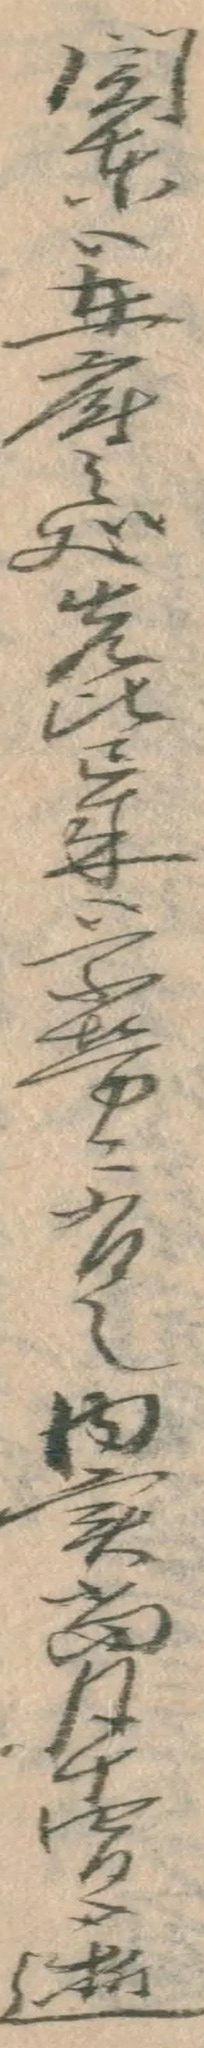関東御在府之処先比已来御所労ニ有之内実當月十四日御逝
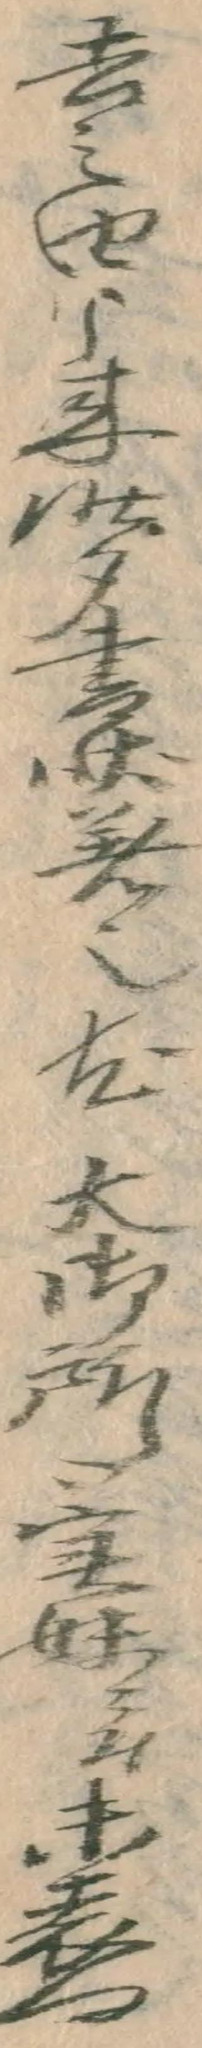去之由申来昨夕書状着也尤大御所御実妹ニ而未表向
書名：賀茂社記録. 第67冊
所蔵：国立国会図書館 National Diet Library, JAPAN
